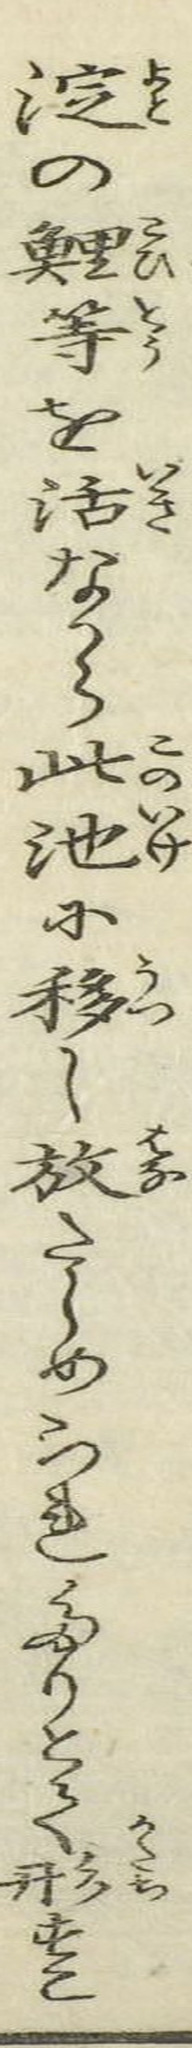淀の鯉等を活なから此池に移し放たしめられたりとて形すこ
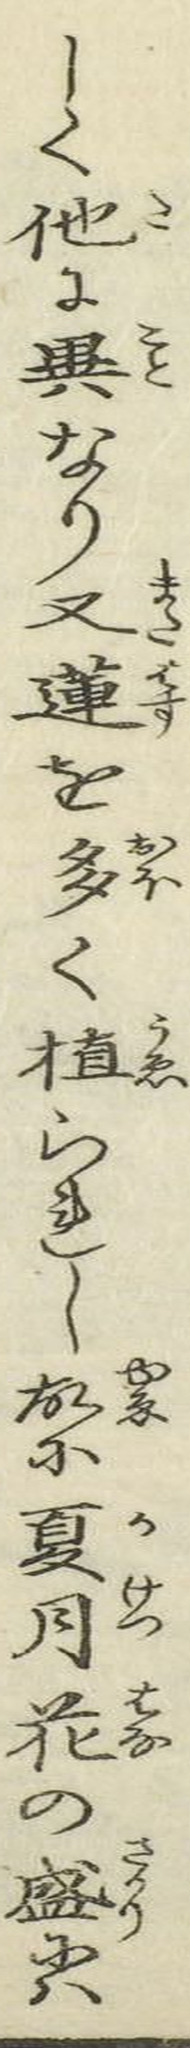しく他に異なり又蓮を多く植られし故に夏月花の盛には
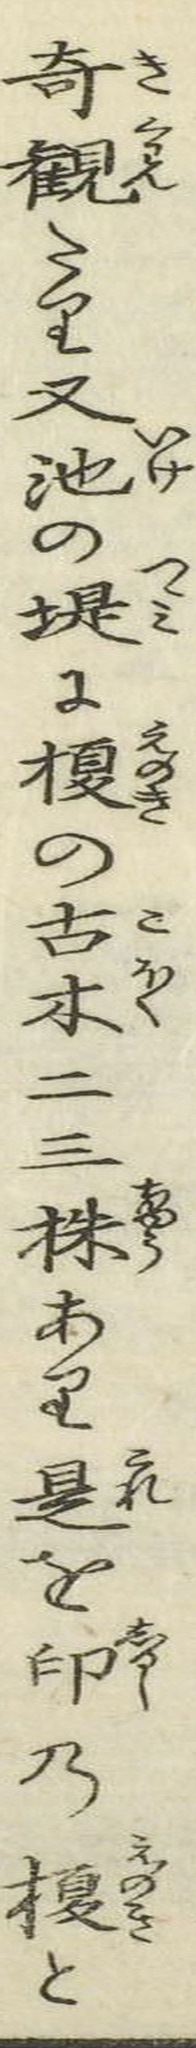奇観たり又池の堤に榎の古木二三株あり是を印の榎と
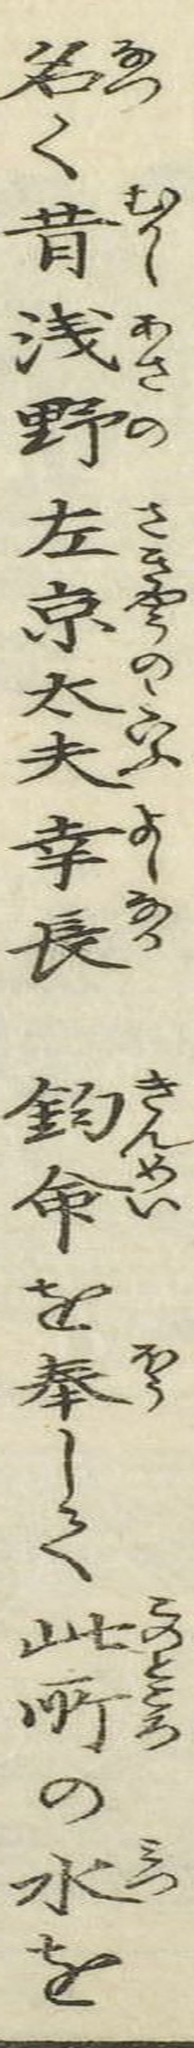名く昔浅野左京太夫幸長釣命を奉して此所の水を
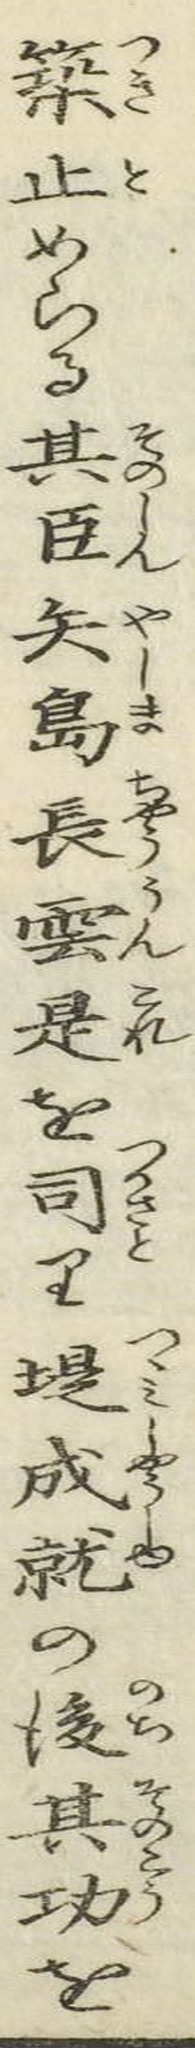築止めらる其臣矢島長雲是を司り堤成就の後其功を
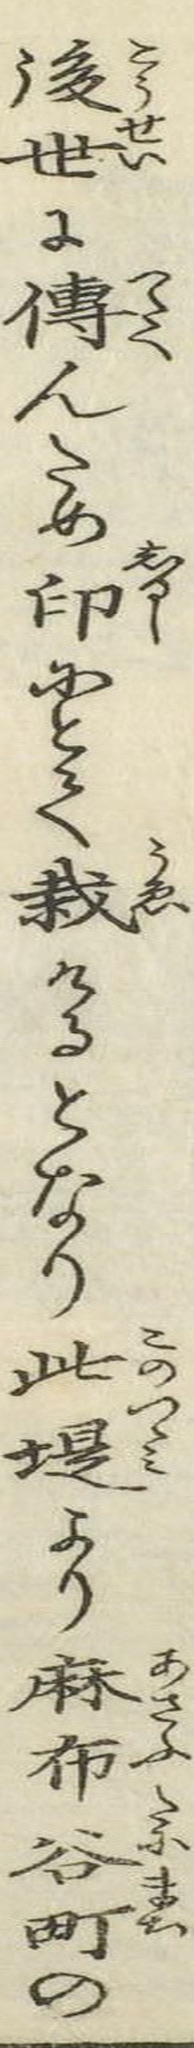後世に傳んため印にとて栽けるとなり此堤より麻布谷町の
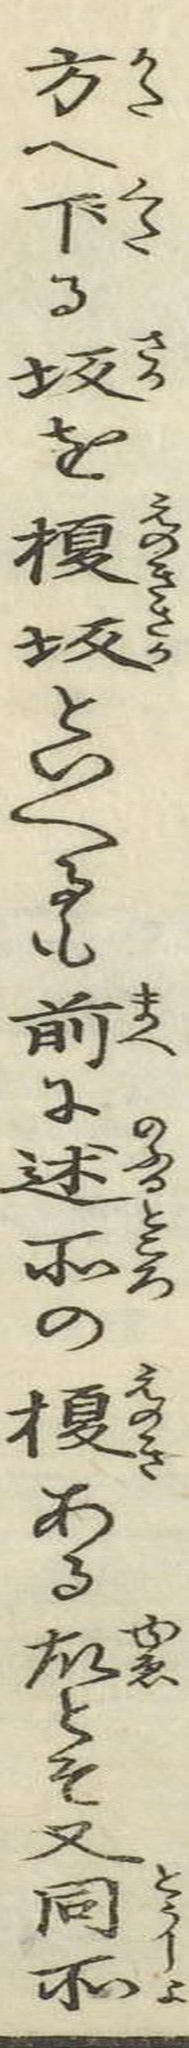方へ下る坂を榎坂といへるも前に述所の榎ある故とそ又同所
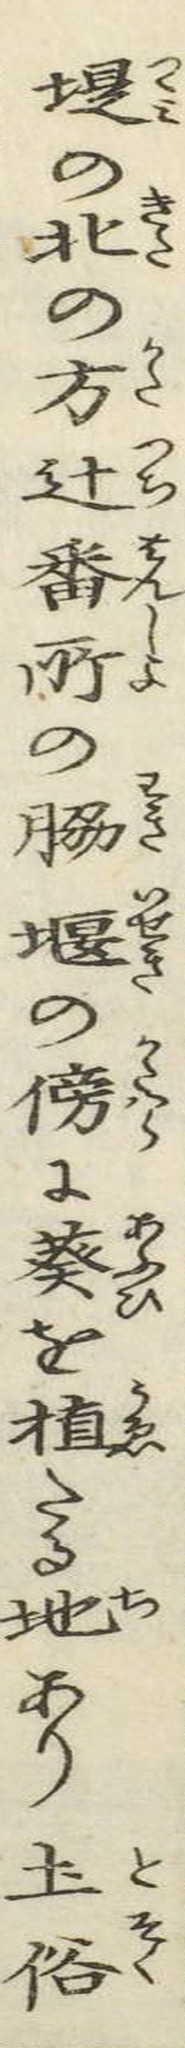堤の北の方辻番所の脇堰の傍に葵を植たる地あり土俗
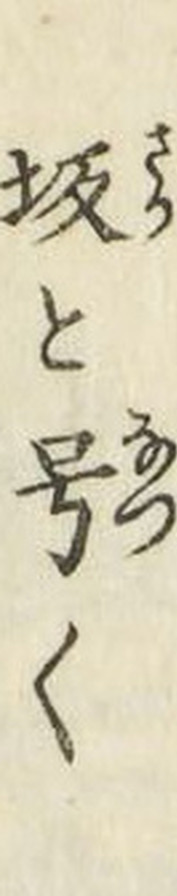坂と号く
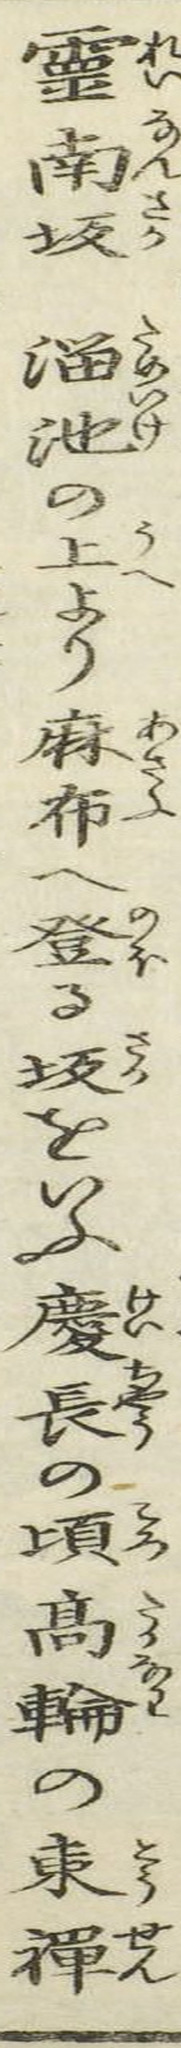靈南坂溜池の上より麻布へ登る坂をいふ慶長の頃高輪の東禪
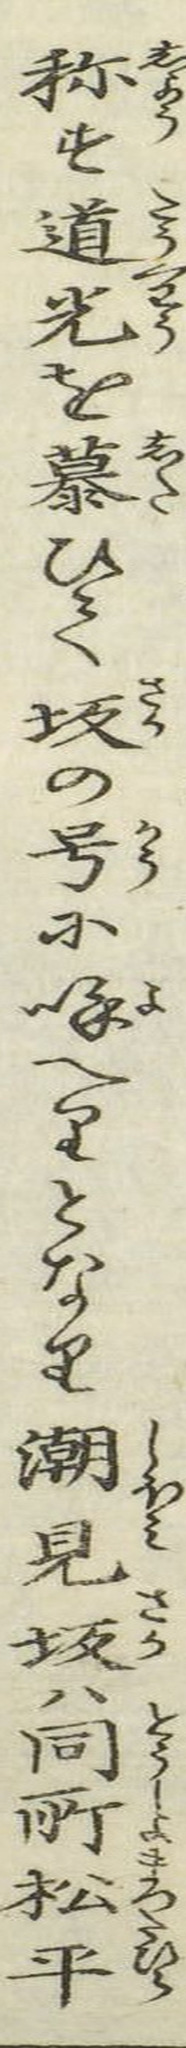称す道光を慕ひて坂の号に呼へりとなり潮見坂は同所松平
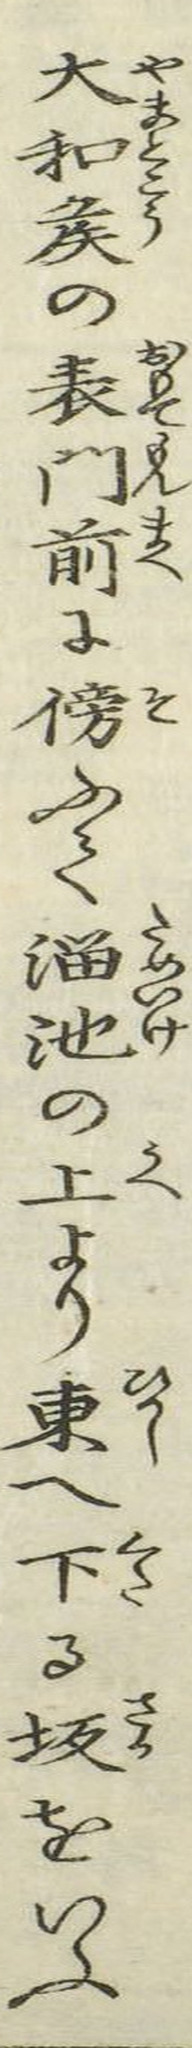大和矦の表門前に傍ふて溜池の上より東へ下る坂をいふ
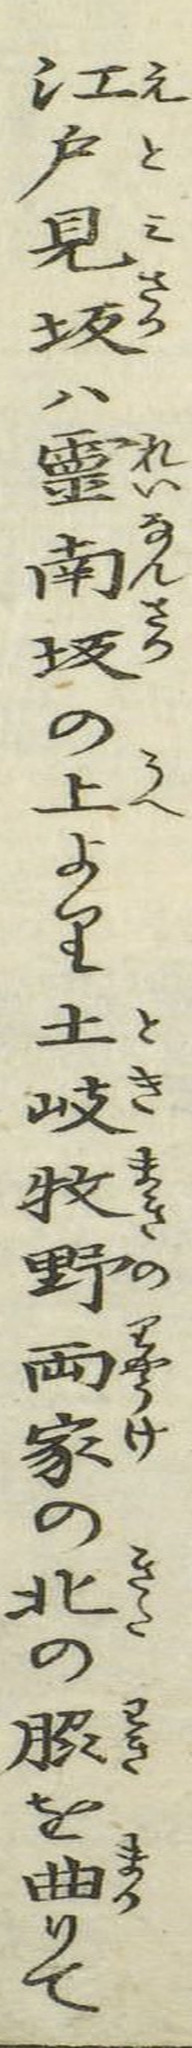江戸見坂は靈南坂の上より土岐牧野両家の北の脇を曲りて
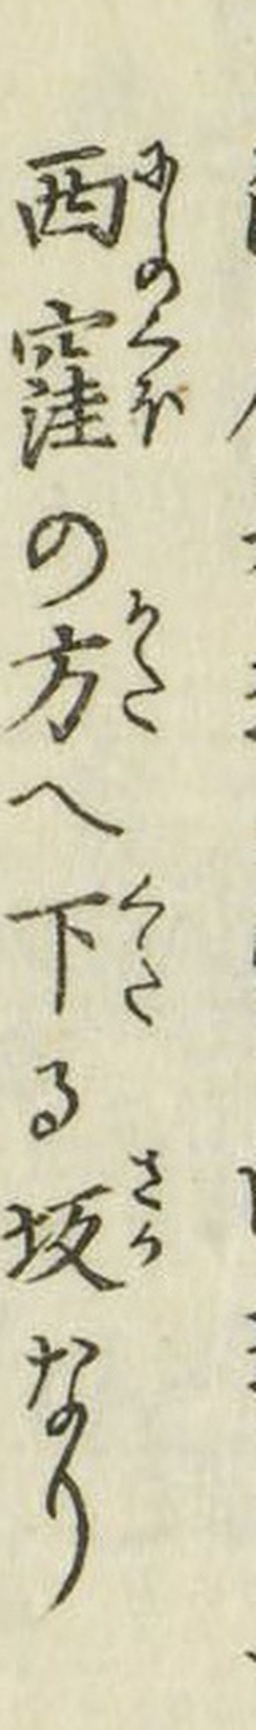西窪の方へ下る坂なり
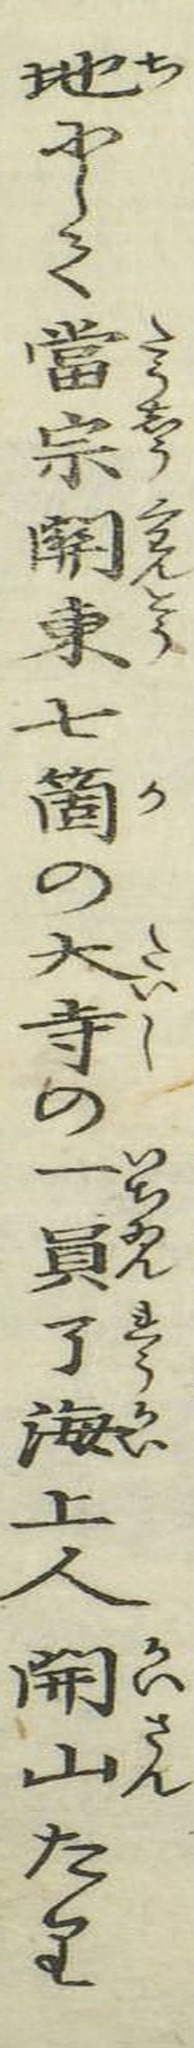地にして當宗關東七箇の大寺の一員了海上人開山たり
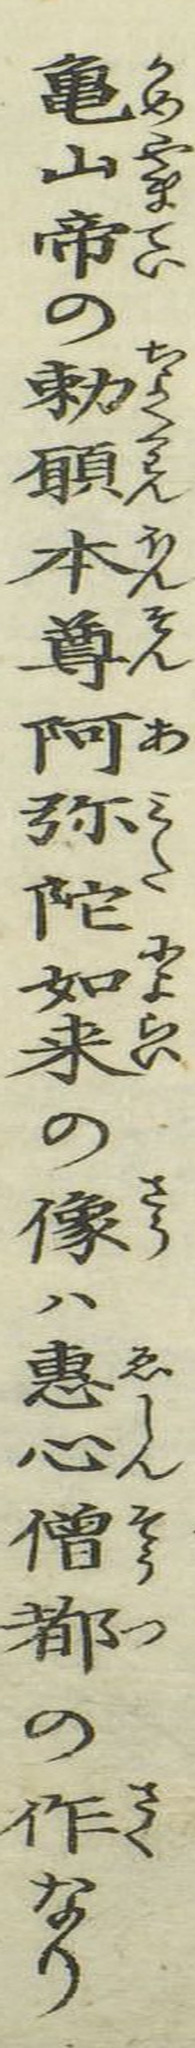亀山帝の勅願本尊阿弥陀如来の像は恵心僧都の作なり
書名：江戸名所図会 20巻 巻之7
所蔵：東京学芸大学教育コンテンツアーカイブ
